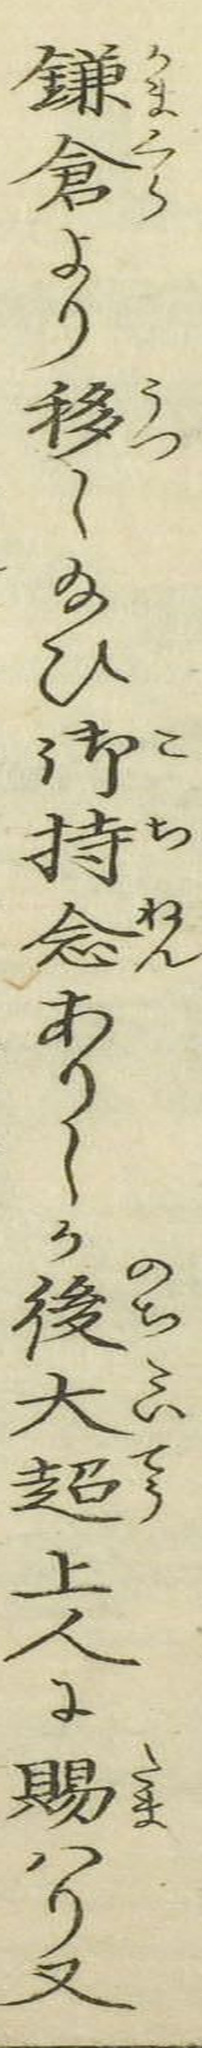鎌倉より移し給ひ御持念ありしか後大超上人に賜はり又
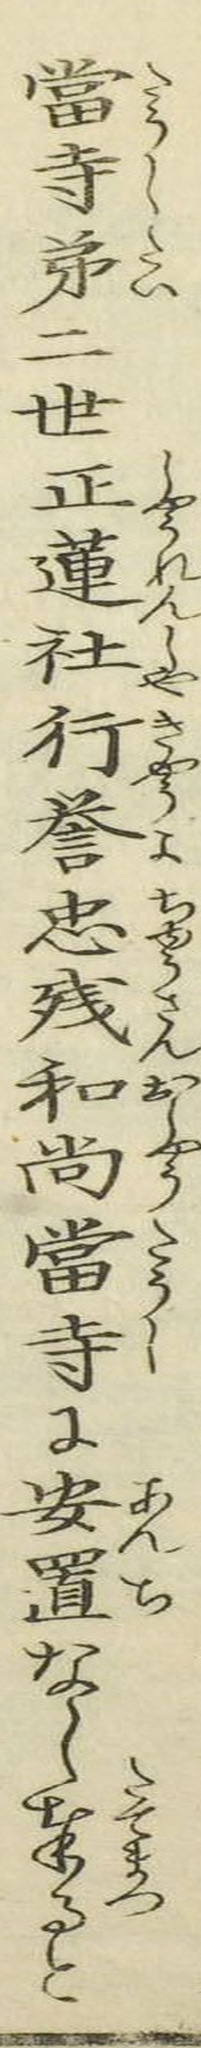当寺第二世正蓮社行誉忠残和尚当寺に安置なし奉ると
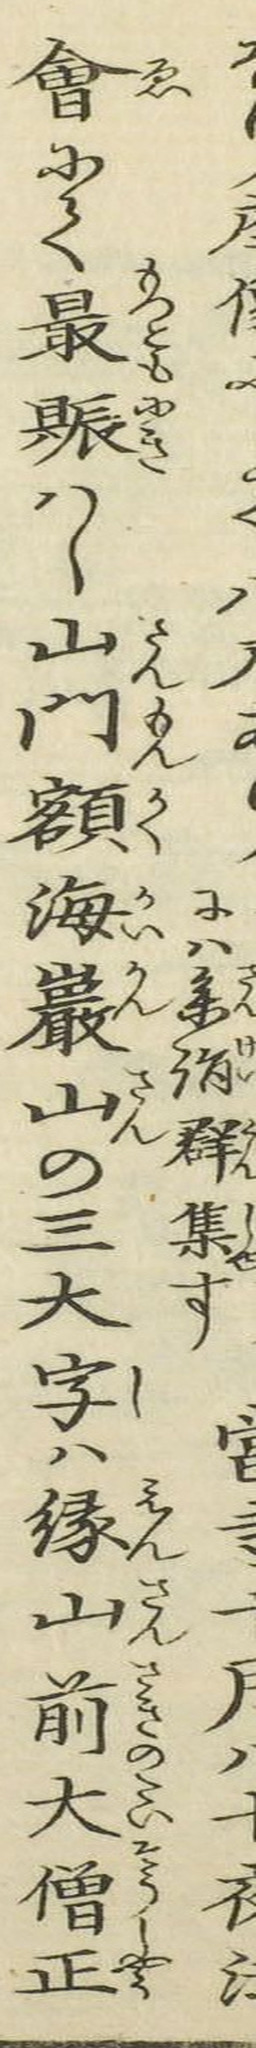会にて最賑はし山門額海厳山の三大字は縁山前大僧正
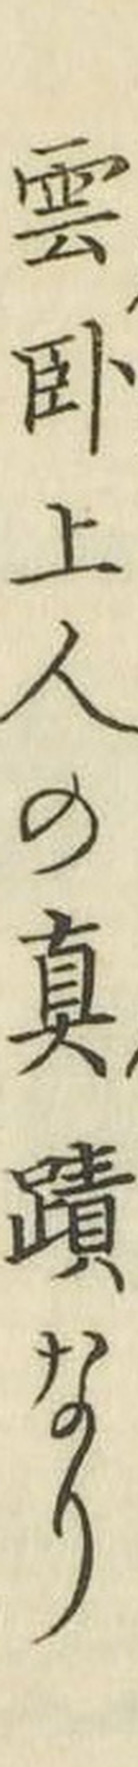雲臥上人の真蹟なり
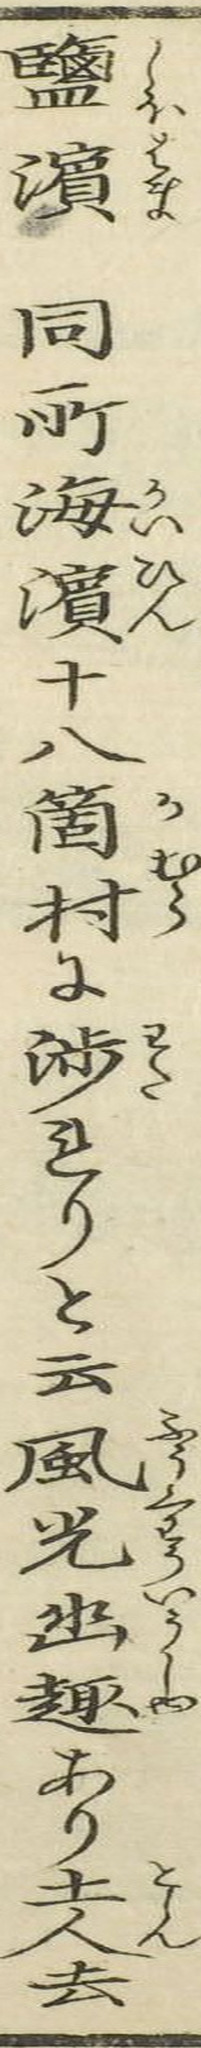塩浜同所海浜十八箇村に渉れりと云風光幽趣あり土人去
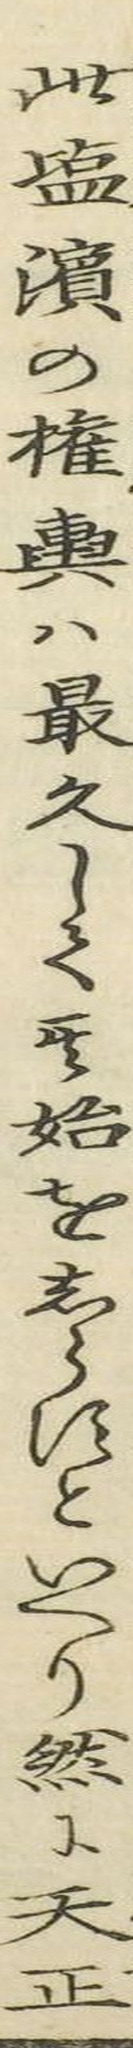此塩浜の権輿は最久して其始をしらすといへりし然に天正
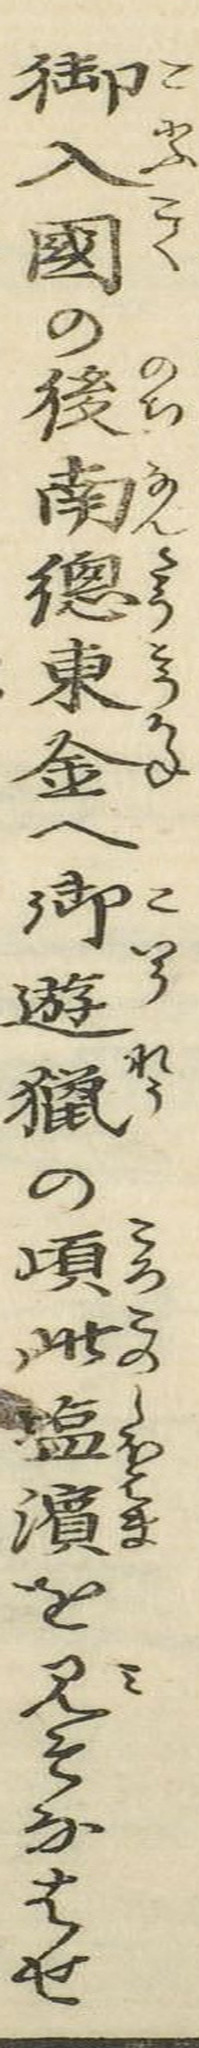御入国の後南総東金へ御遊猟の頃此し塩浜を見そなはせ
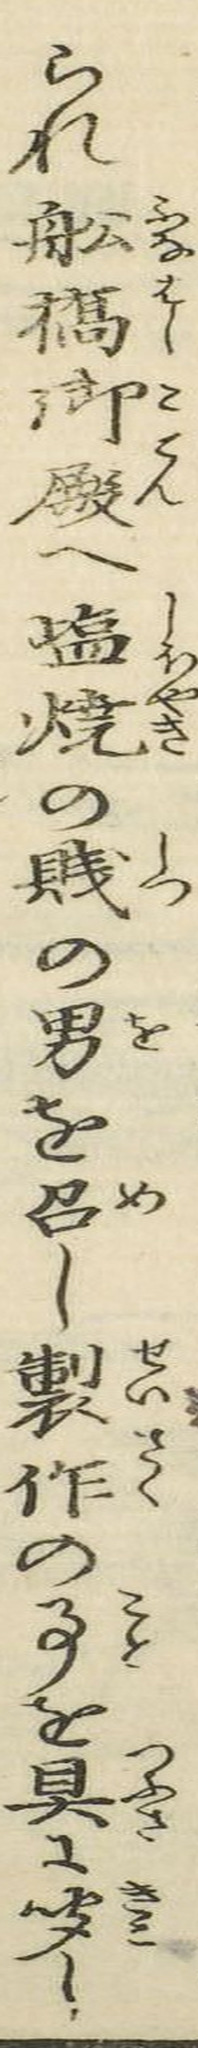られ船橋御殿へ塩焼の賤の男を召し制作の事を具に聞し
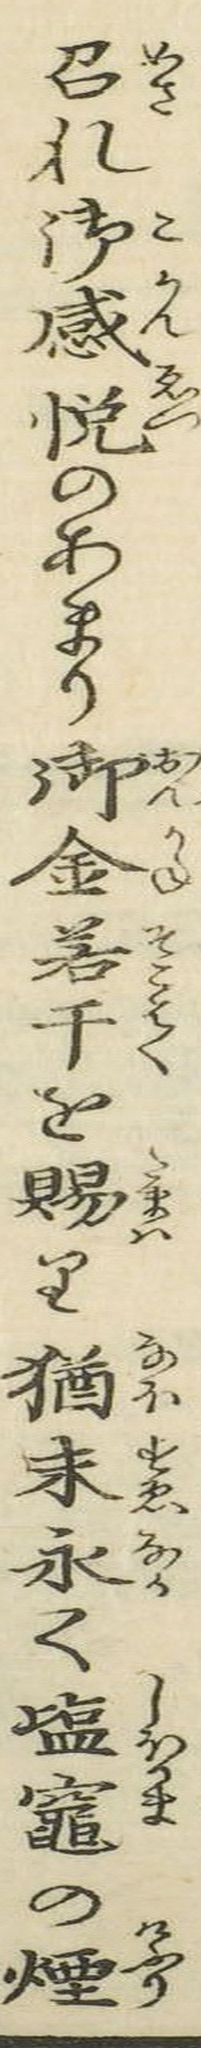召れ御感悦のあまり御金若干を賜り猶末永く塩竃の煙
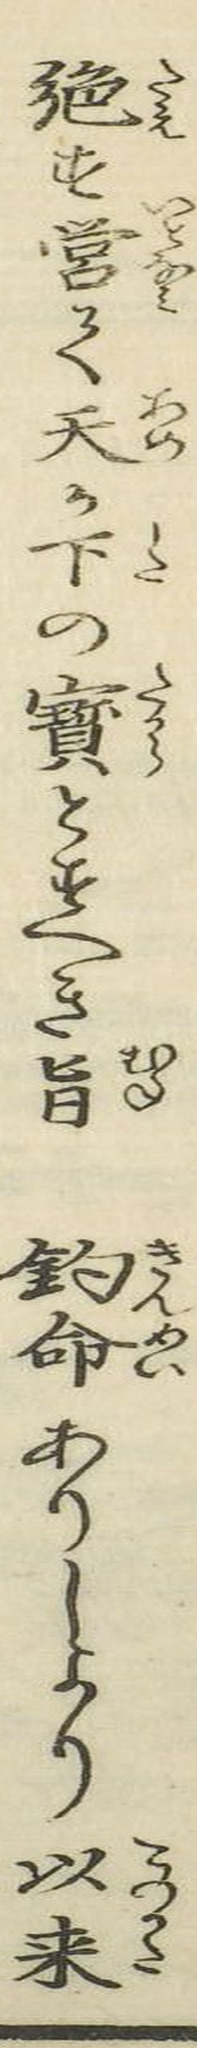絶す営て天か下の宝としすへき旨鈞命ありしより以来
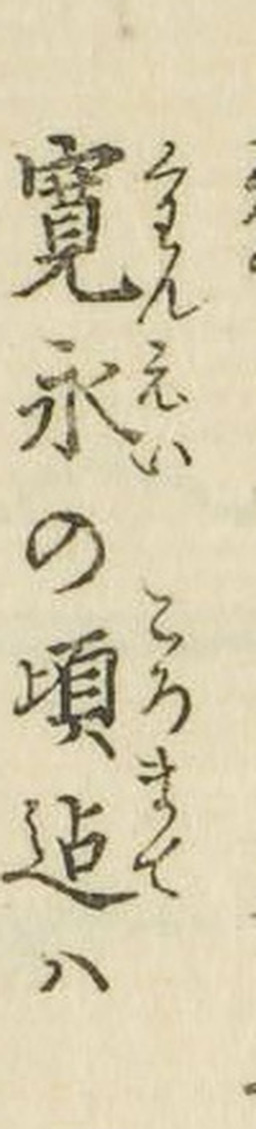寛永の頃迄は
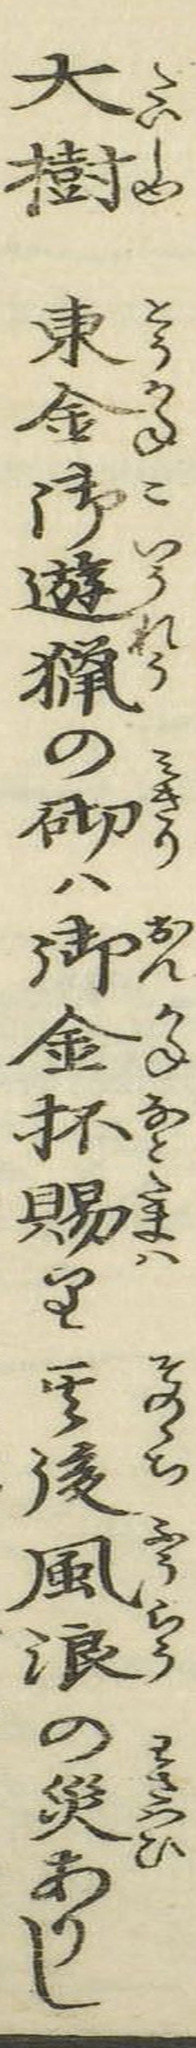大樹東金御遊猟の砌は御金抔賜り其後風浪の災ありし
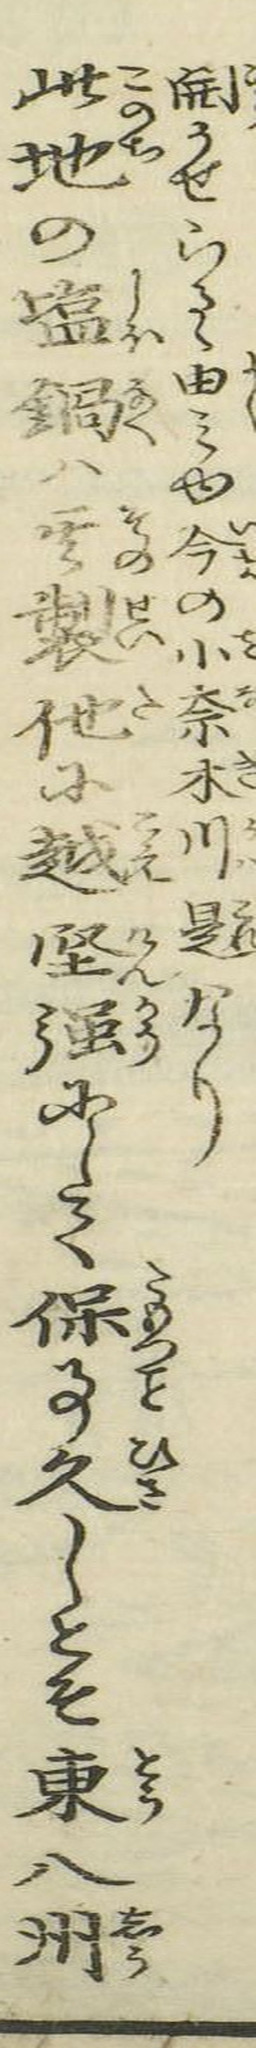此地の塩鍋は其製他に越堅強にして保事久しとそひが東八州
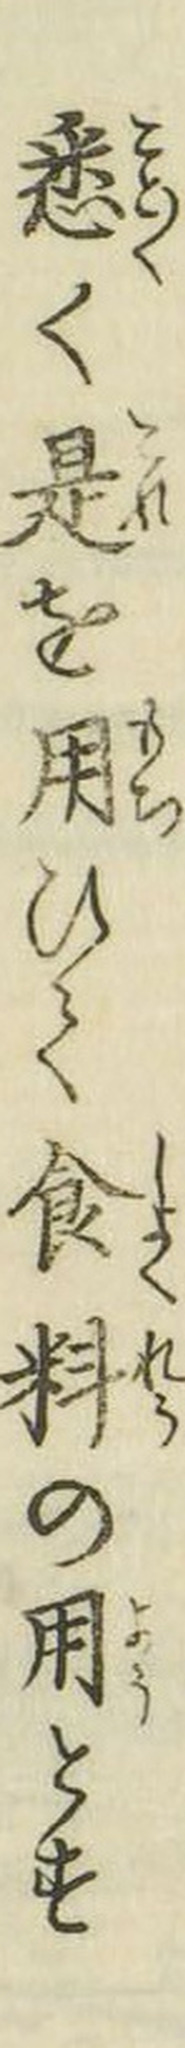悉く是を用ひて食料の用とす
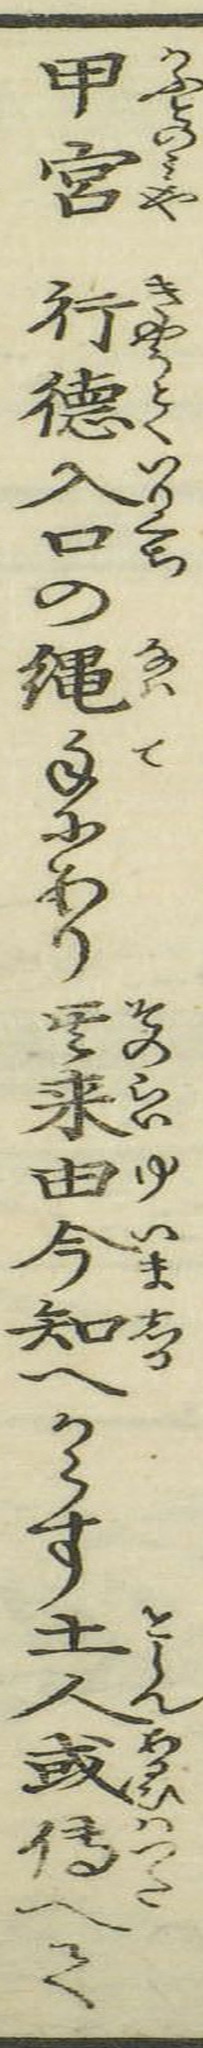甲宮行徳入口の縄手にあり其来由今知へからす土人或伝へて
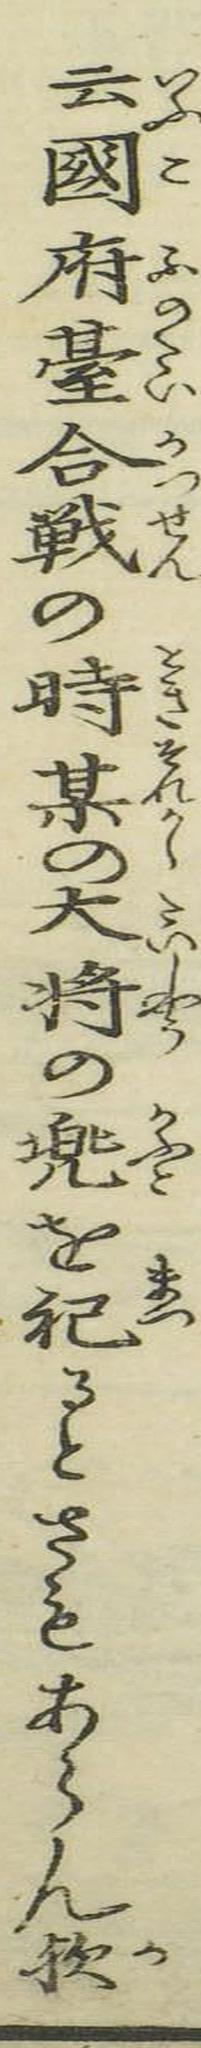伝国府台合戦の時某の兜を祀るとさもあらん歟
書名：江戸名所図会 20巻 巻之20
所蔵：東京学芸大学教育コンテンツアーカイブ
